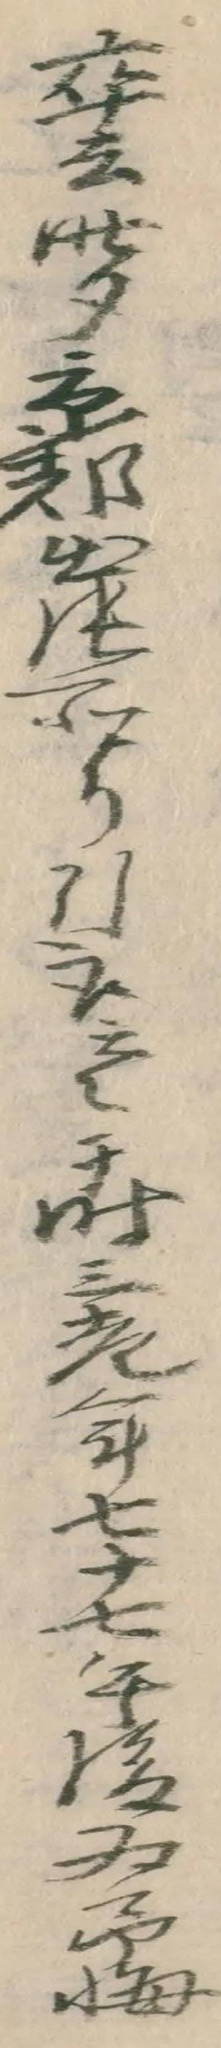卒去昨夕京都出張所より引取云〻于時三老年七十七午後為弔悔
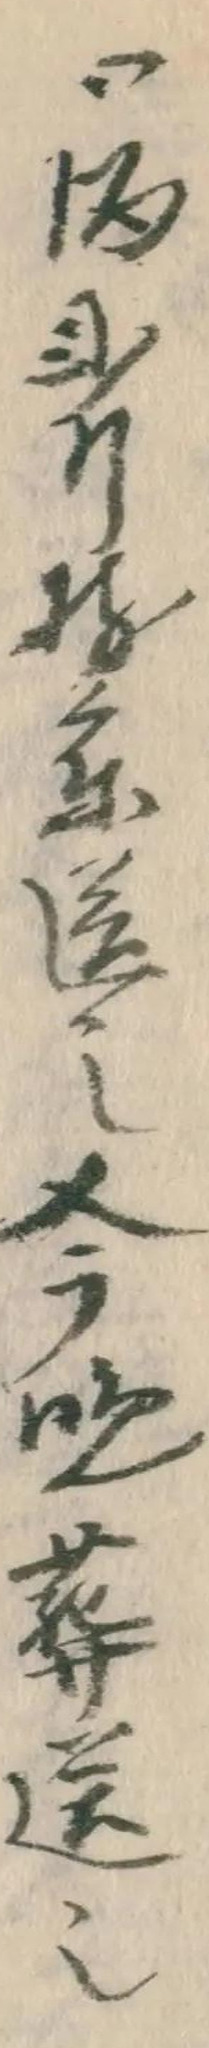御酒弐升持参送之今晩葬送也
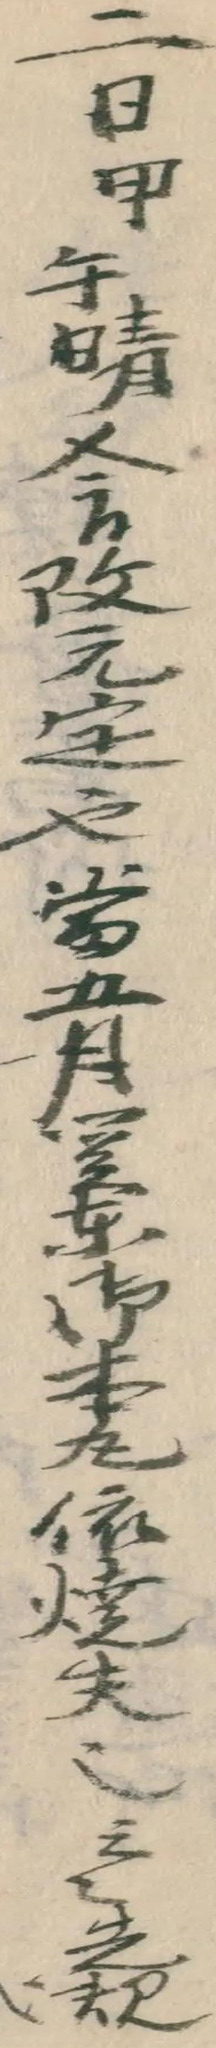二日甲午晴今日改元定也當五月関東御本丸依焼失也云々先規歟
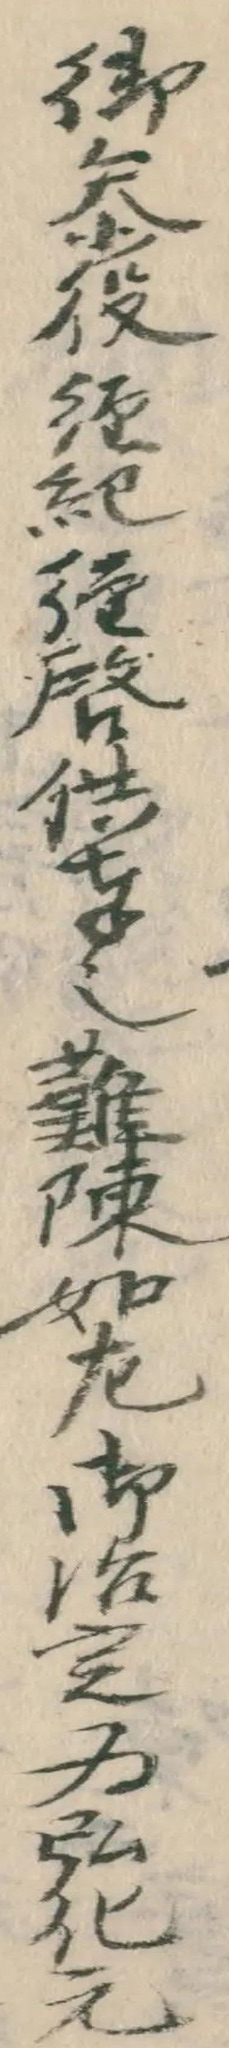御参役経紀経啓供奉也難陳如左御治定為弘化元

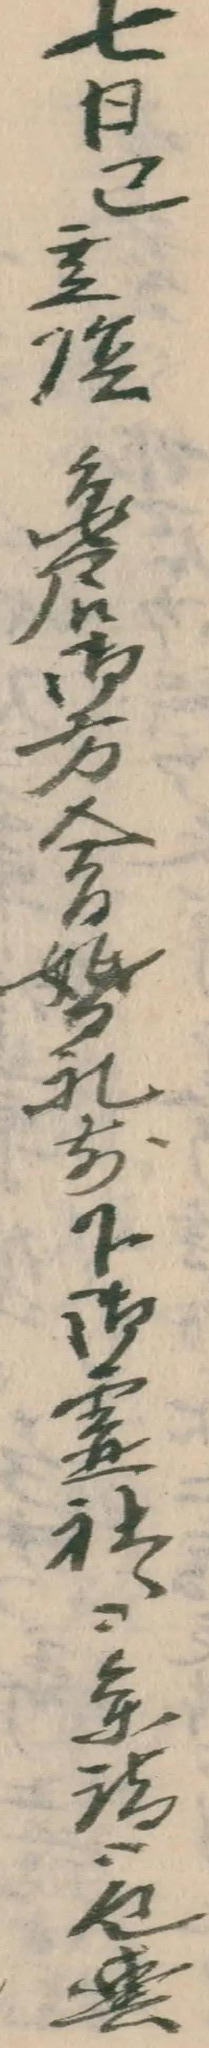七日己亥陰亀君御方今日婚礼前下御霊社へ御参詣御包輿
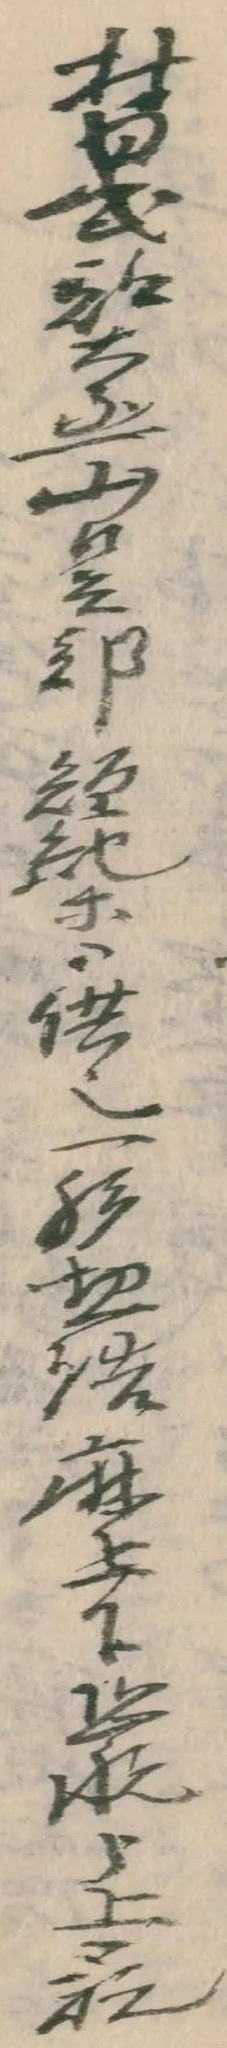村田式部大丞山口兵部経紀等御供也一統惣詰麻上下恐悦申上御祝
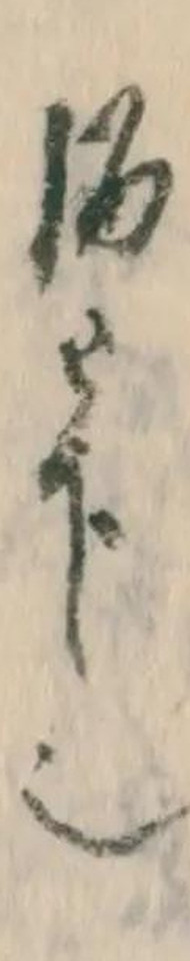酒被下也
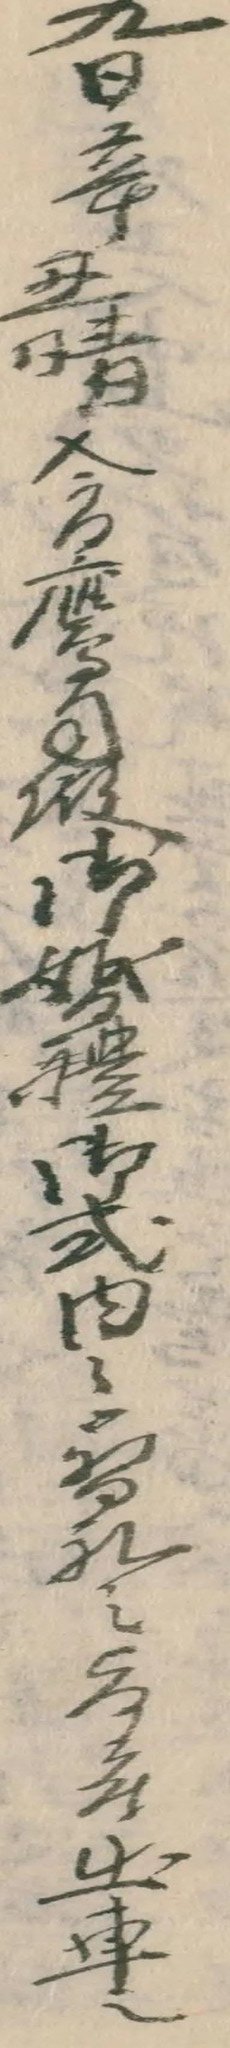九日辛丑晴文音鷹司殿御婚禮御式内之御習礼之旨ニ付出車之
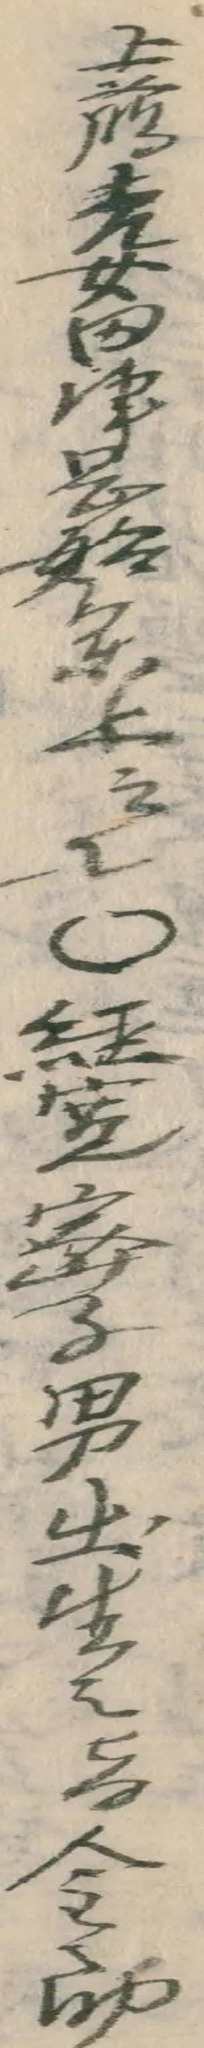上臈老女田津岡始参上云々○経寛密子男出生之旨金之助
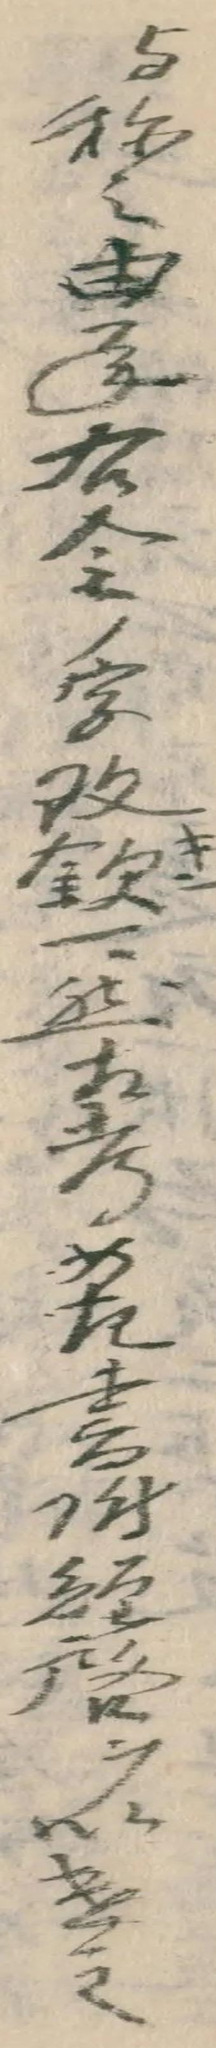と称之由承右金ノ字改欽可然相考如左書附経啓ヲ以遣之
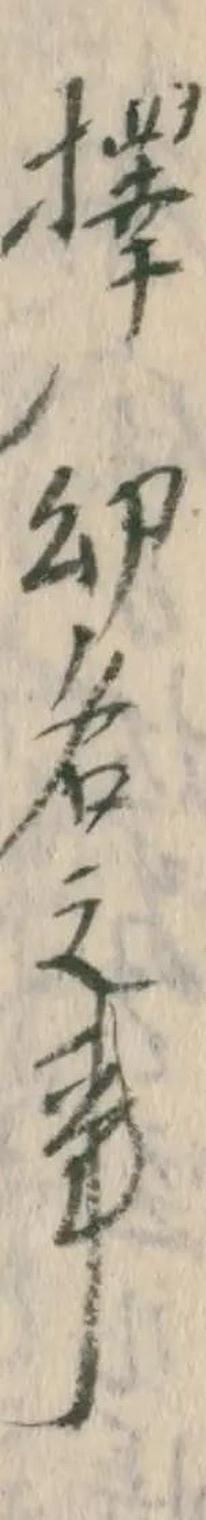擇幼名之事
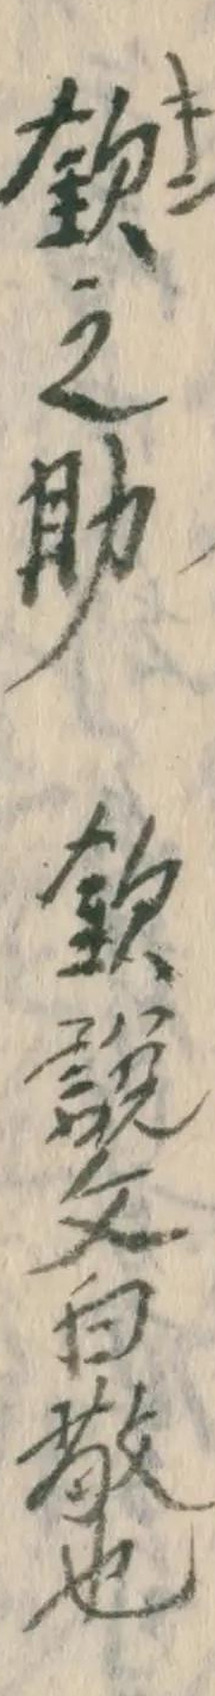欽之助欽説文曰敬也
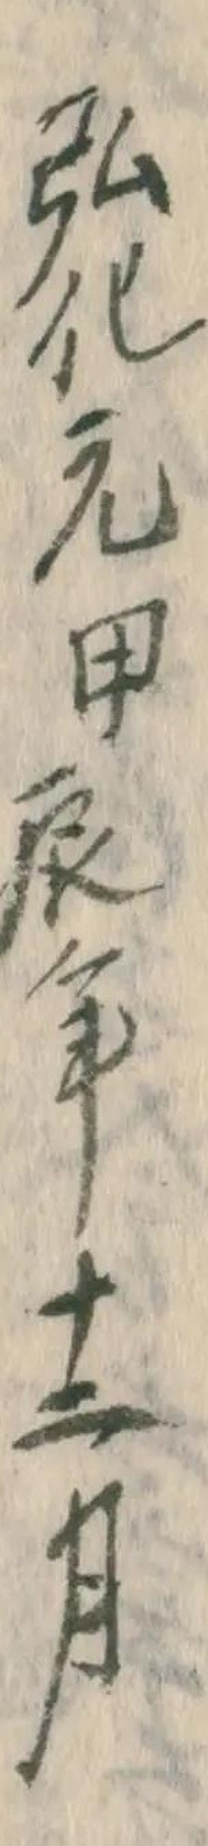弘化元甲辰年十二月
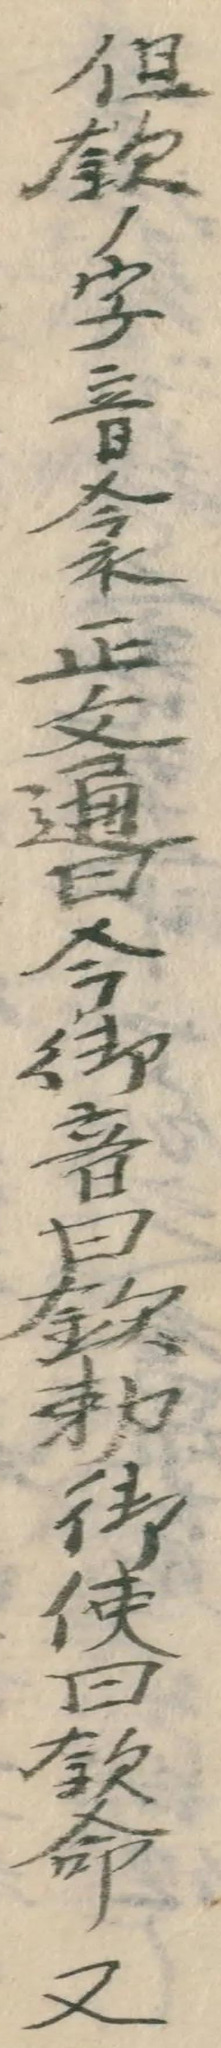但欽ノ字音今永正文通曰今御音曰欽勅御使曰欽命又
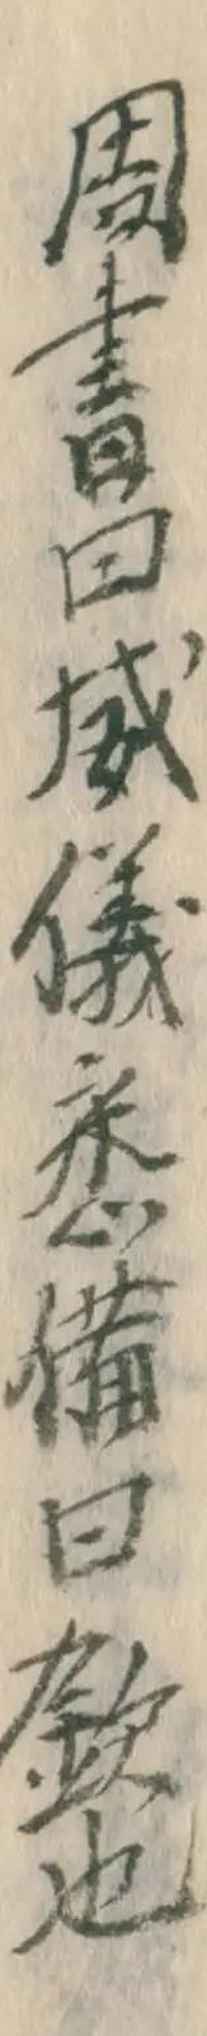周書曰威儀悉備曰欽也
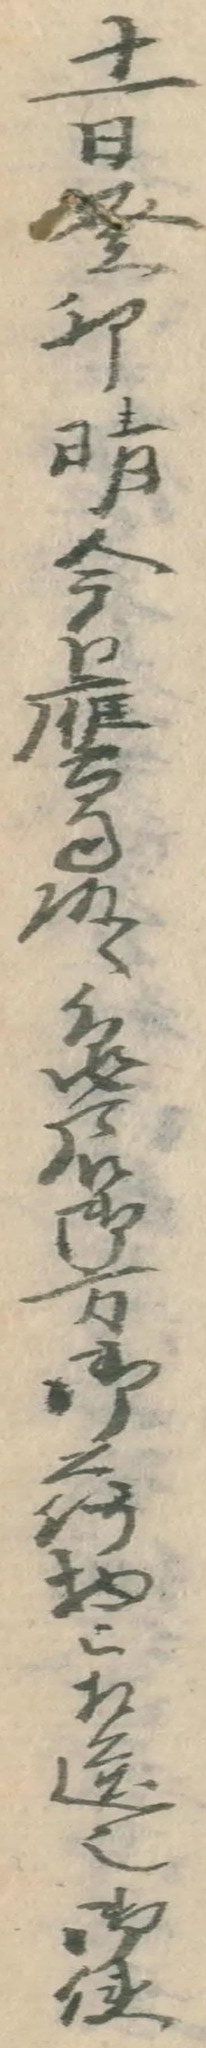十一日癸卯晴今日鷹司殿へ亀君御方御荷物被相送也御使
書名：賀茂社記録. 第69冊
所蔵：国立国会図書館 National Diet Library, JAPAN
